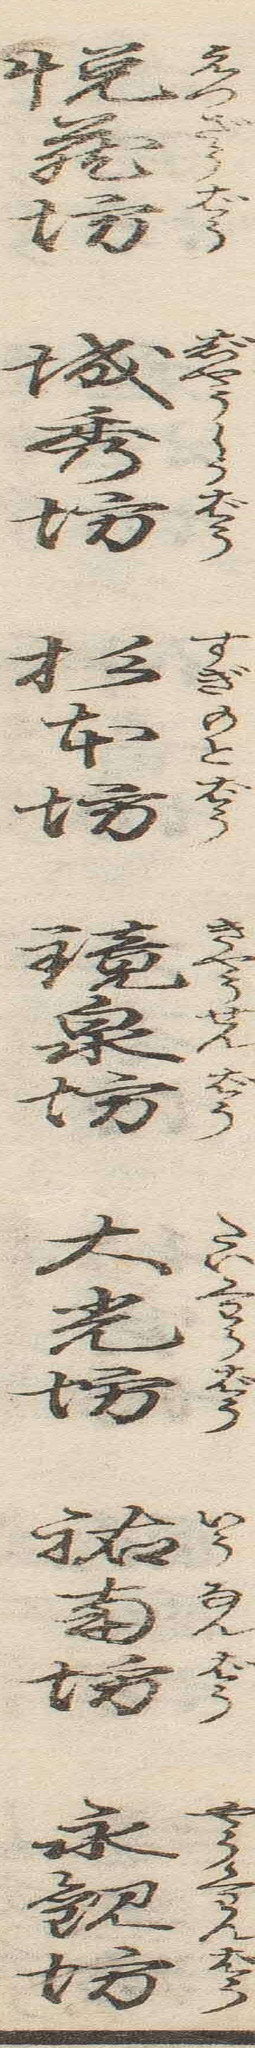悦蔵坊城秀坊杉本坊鏡泉坊大光坊祐南房永觀坊
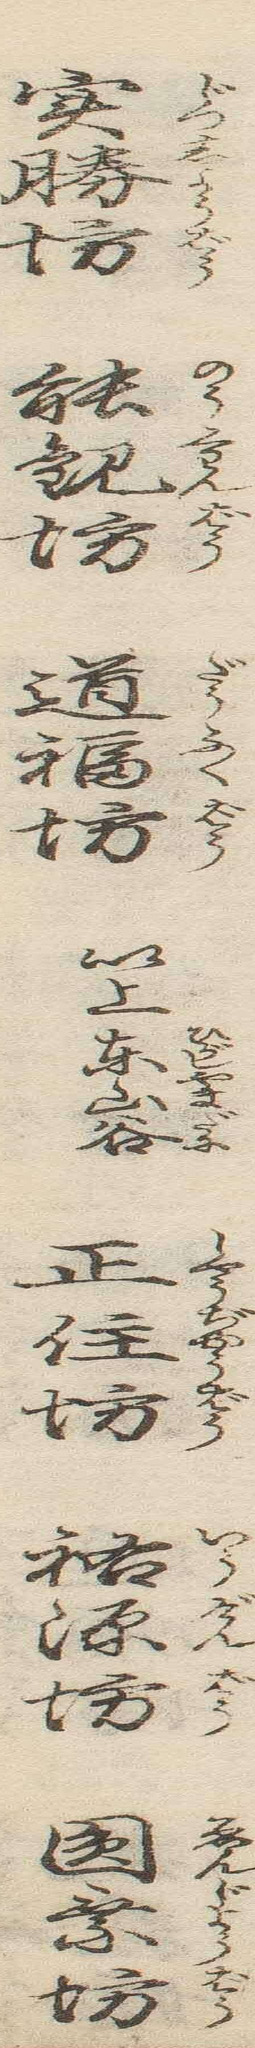実勝坊能觀坊道福坊以上東山谷正住坊祐源坊圓乘坊

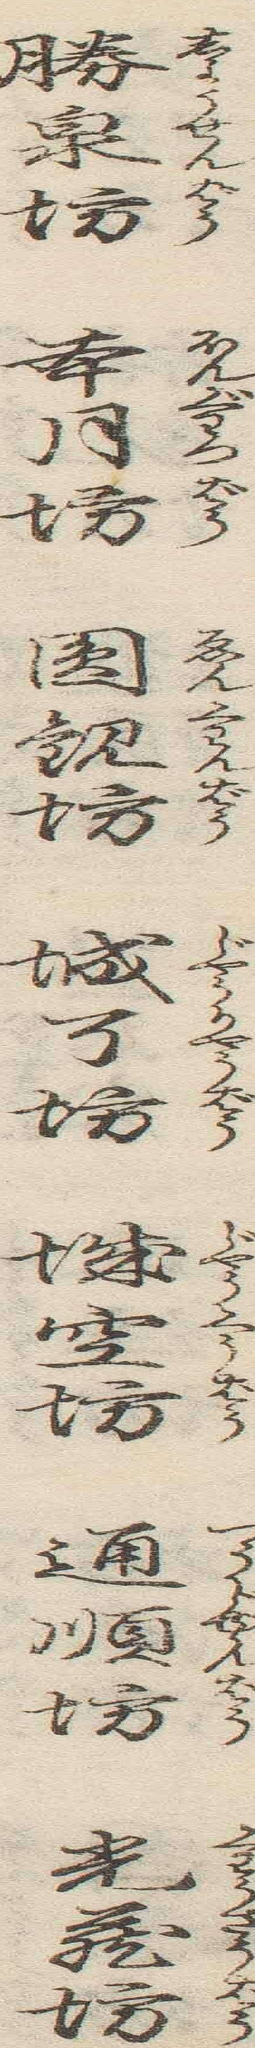勝泉坊本月坊圓觀坊城了坊城空坊通順坊光蔵坊
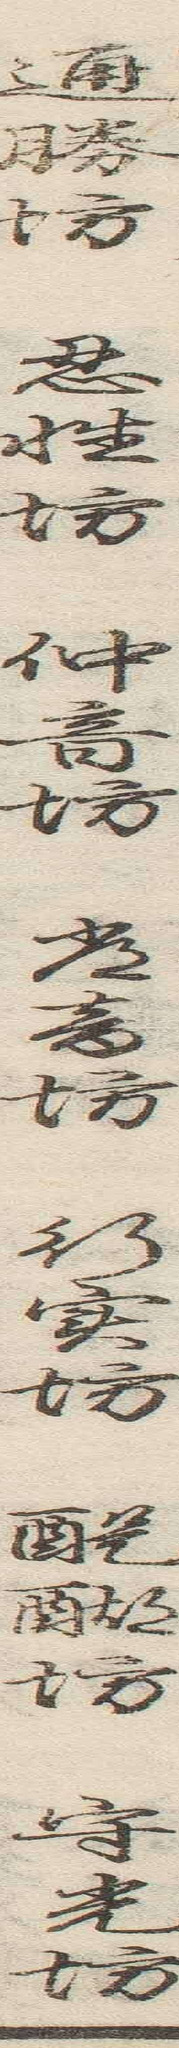通勝坊忍性坊仲音坊常音坊行実坊醍醐坊守光坊
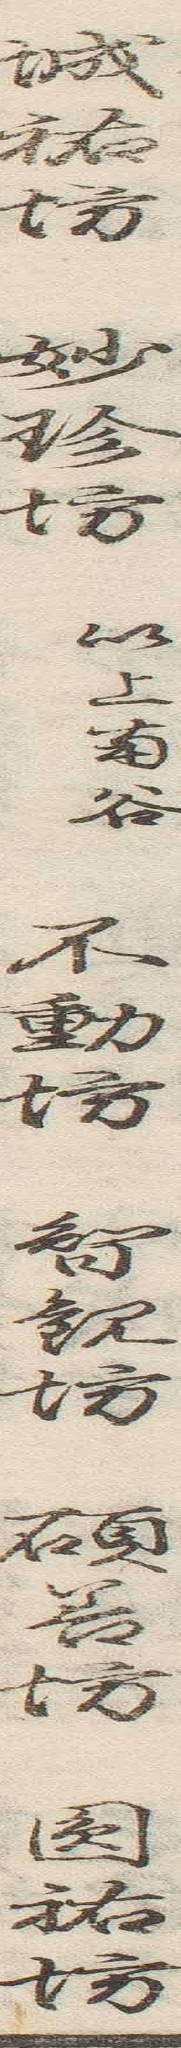城祐坊妙珍坊以上南谷不動坊智觀坊碩善坊圓祐坊
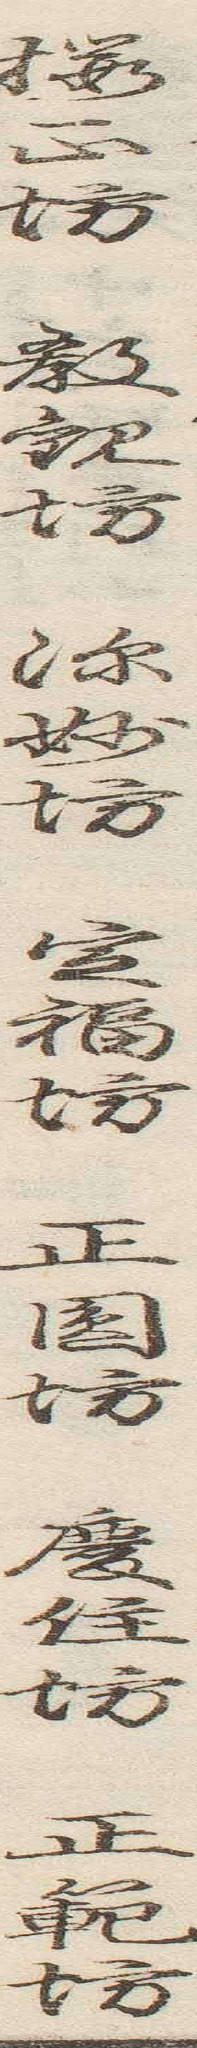桜正坊敎觀坊深妙坊定福坊正圓坊慶住房正範坊
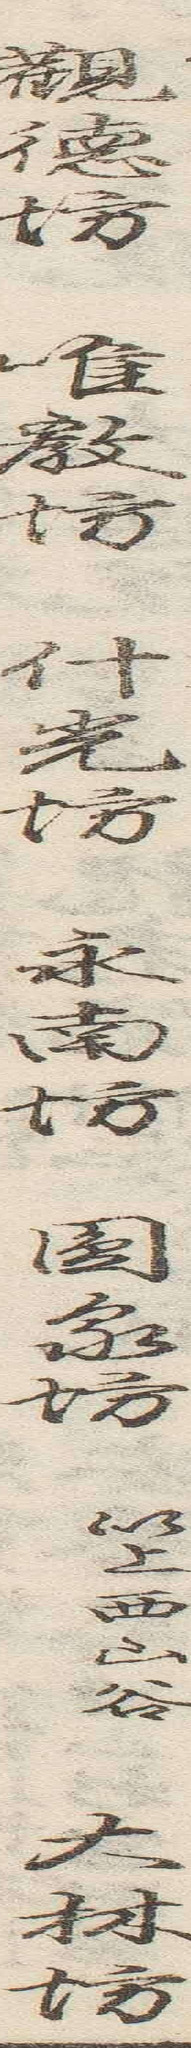觀徳坊唯敎坊什光坊永南房圓泉坊以上西山谷大林坊
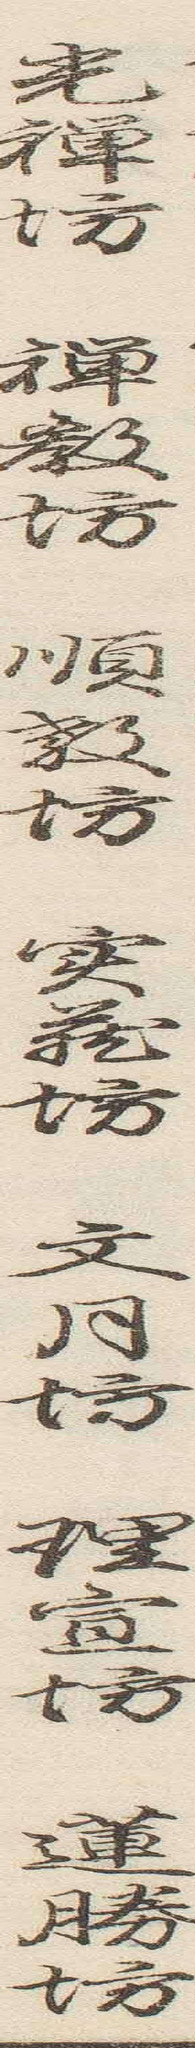光禅坊禅敎坊順敎坊実蔵坊文月坊理宣坊蓮勝坊
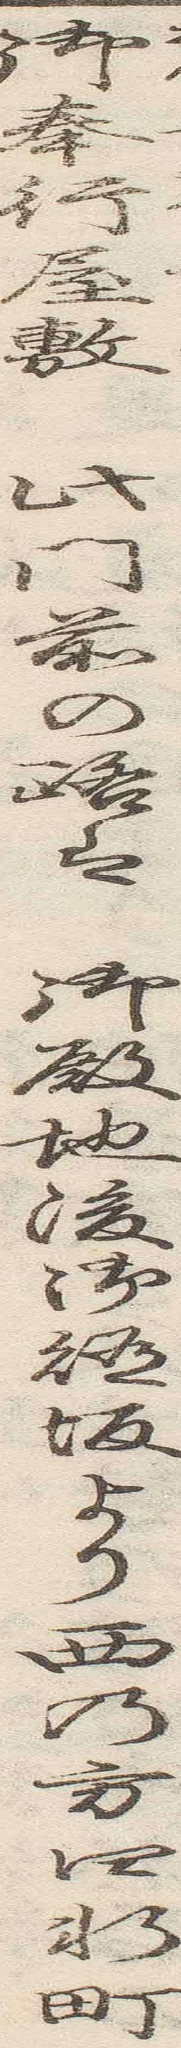御奉行屋敷此門前の路は御殿地後御賄坂より西の方四軒町
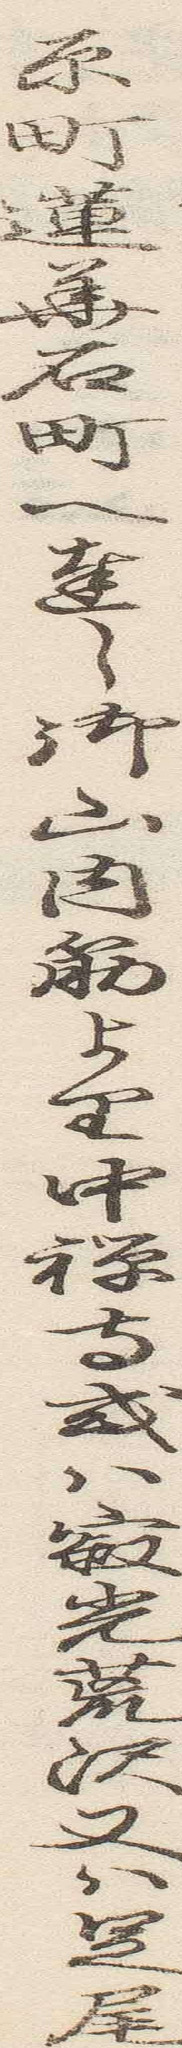原町蓮華石町へ達し御山内筋より中禅寺或は寂光荒沢又は足尾
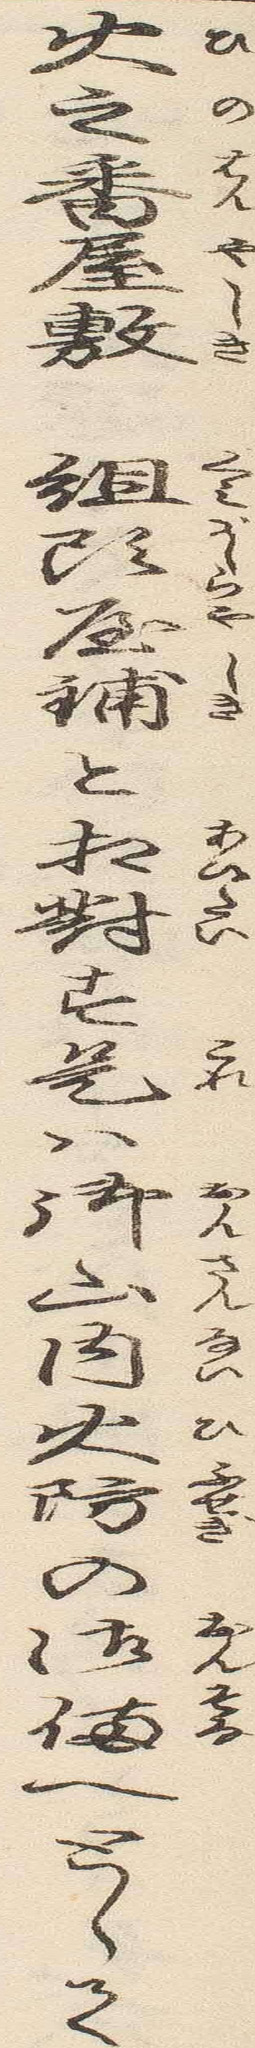火之番屋敷組頭屋鋪と相對す是は御山内火防の御備へとして
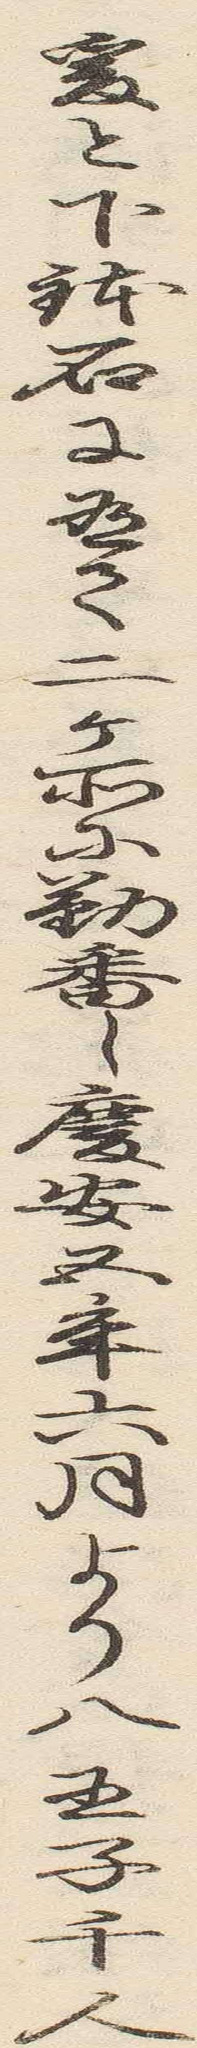爰と下鉢石に有て二ヶ所に勤番し慶安五年六月より八王子千人
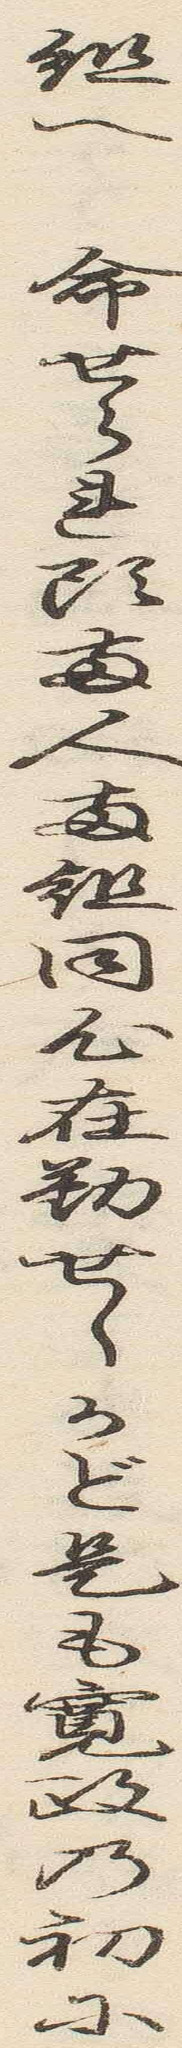組へ命ぜられ頭両人両組同心在勤せしかど是も寛政の初に
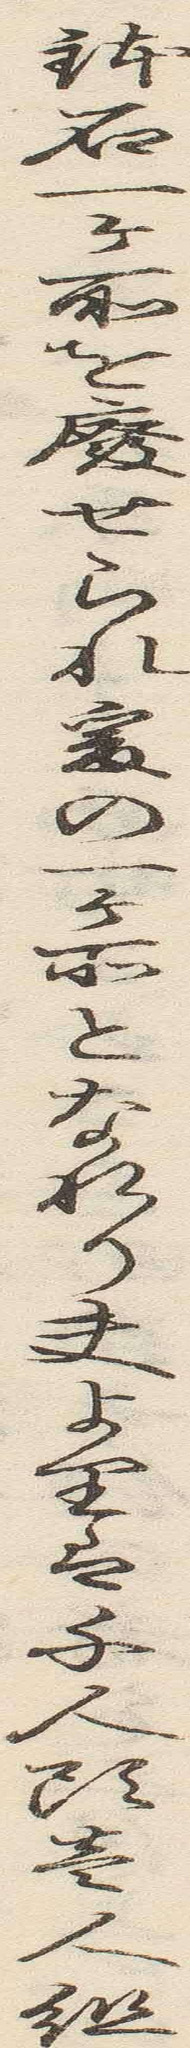鉢石一ヶ所を廢せられ爰の一ヶ所となれり夫よりは千人頭壱人組
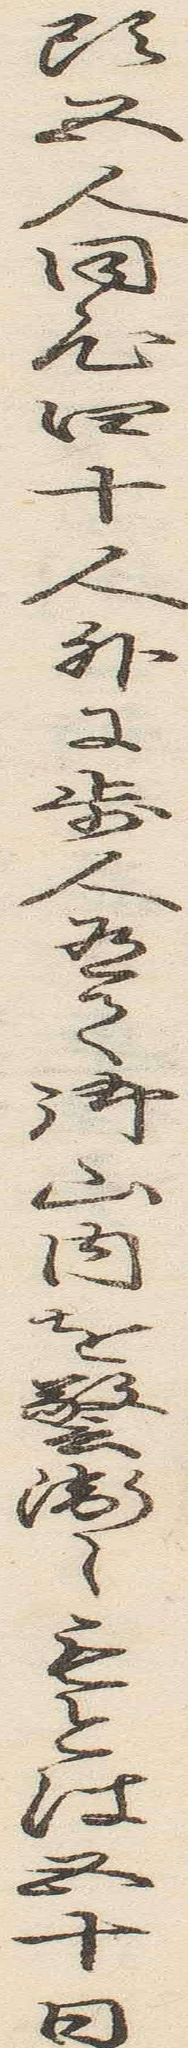頭五人同心四十人外に歩人有て御山内を警衛しもとは五十日
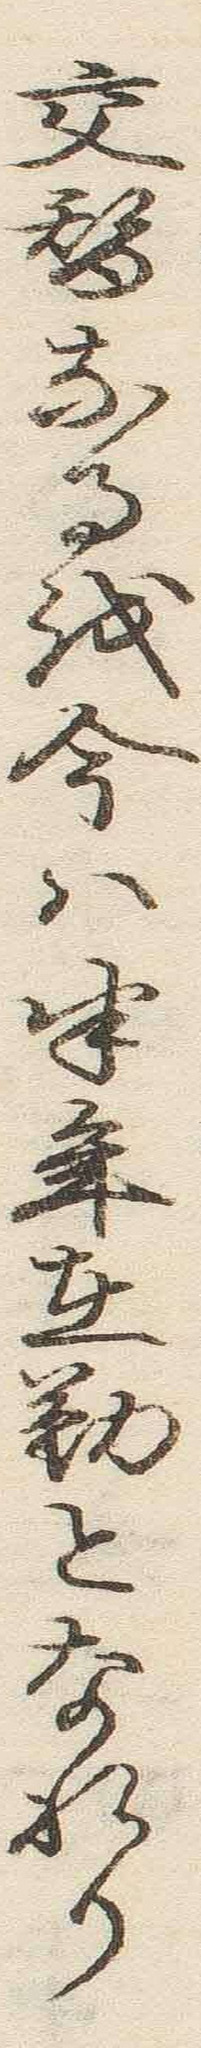交替なるを今は半年在勤となれり
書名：日光山志
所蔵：東京学芸大学附属図書館 国文学研究資料館
